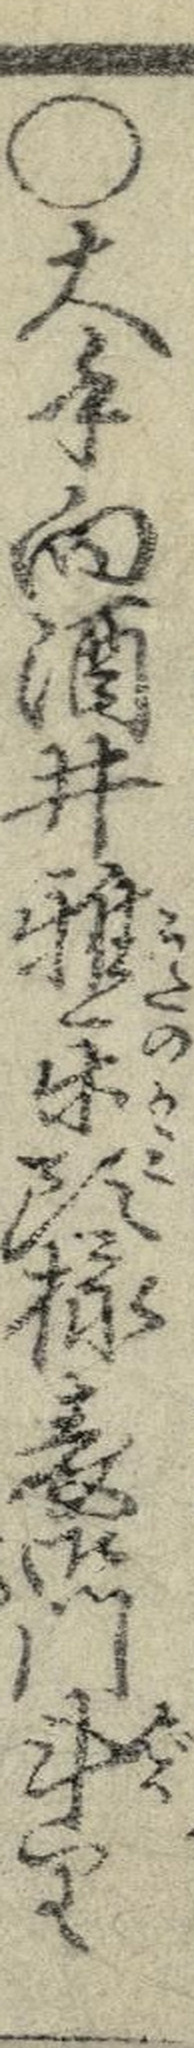〇大手向酒井雅樂頭様表御門斗り
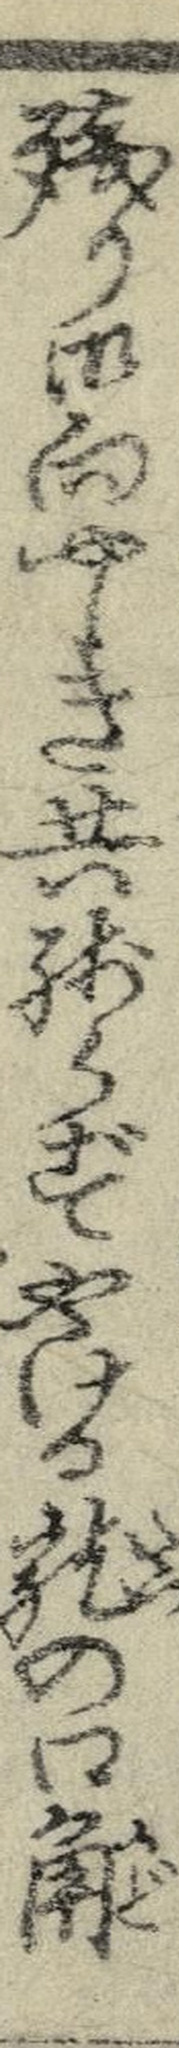残り御向やしき共残らずやける龍の口角
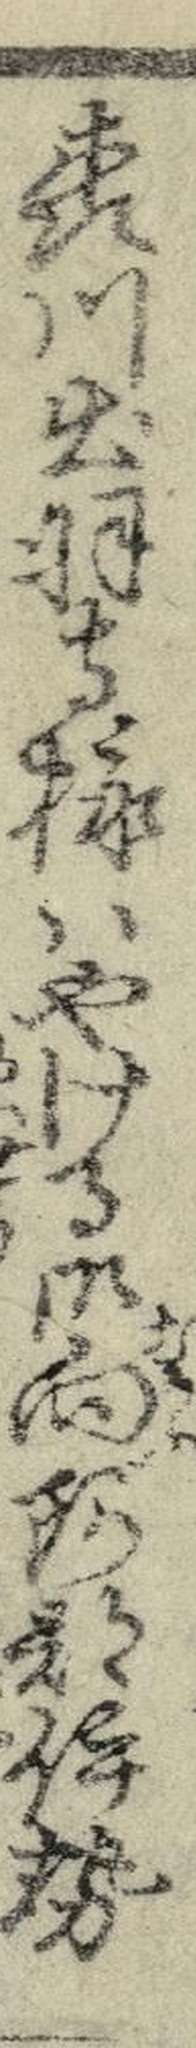森川出羽守様ハやける御向阿部伊勢
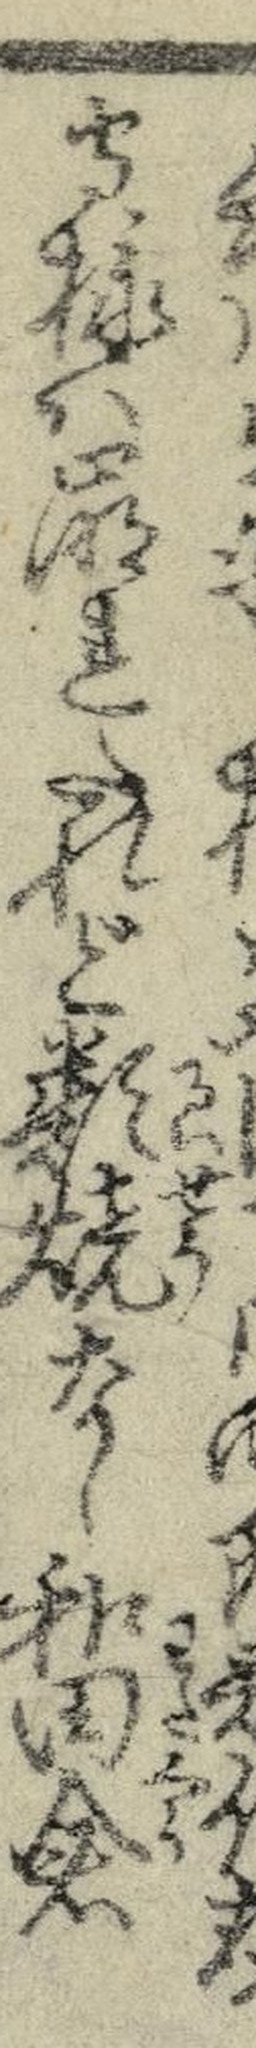守様ハ崩れたれど類焼なし和田倉
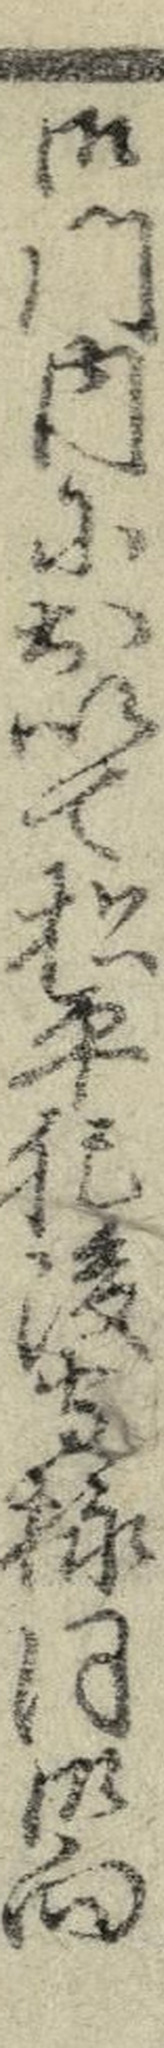御門内において松平肥後守様同御向
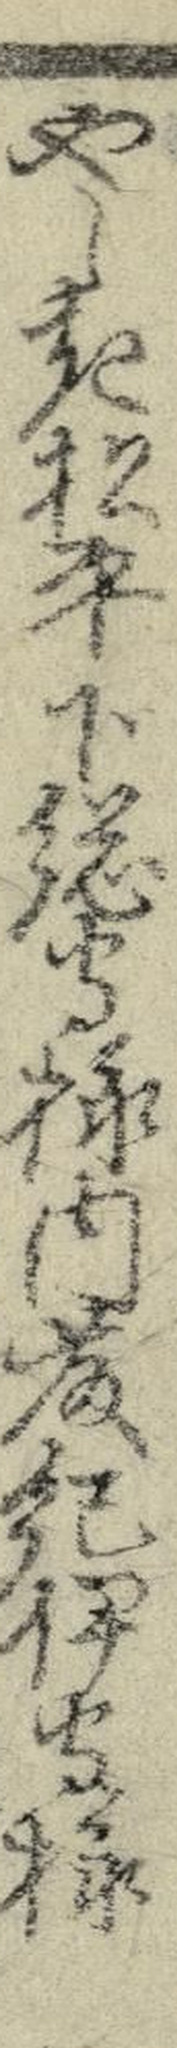やしき松平下総守様内藤紀伊守様
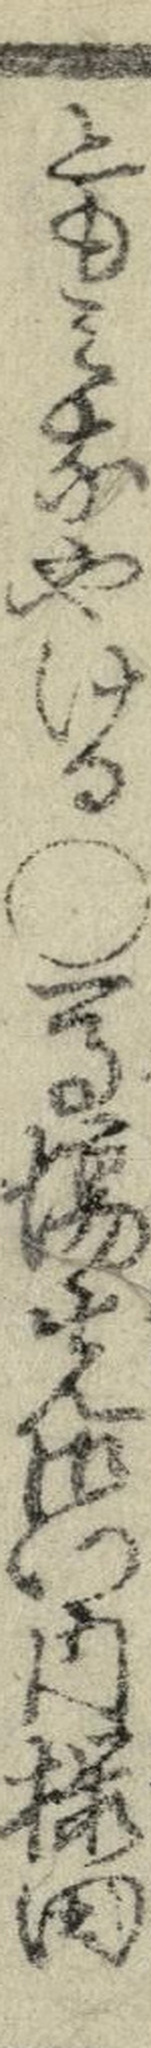ともみなやける〇馬場先御門内桜田
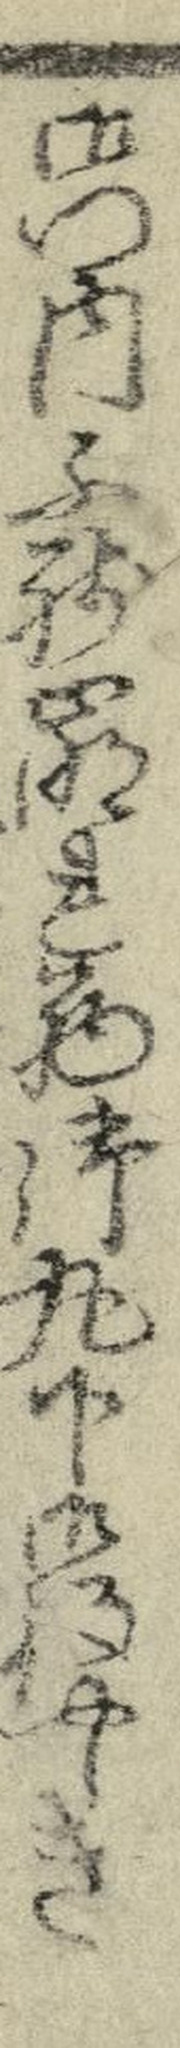御門内不残崩れ西御凡下御役やしき
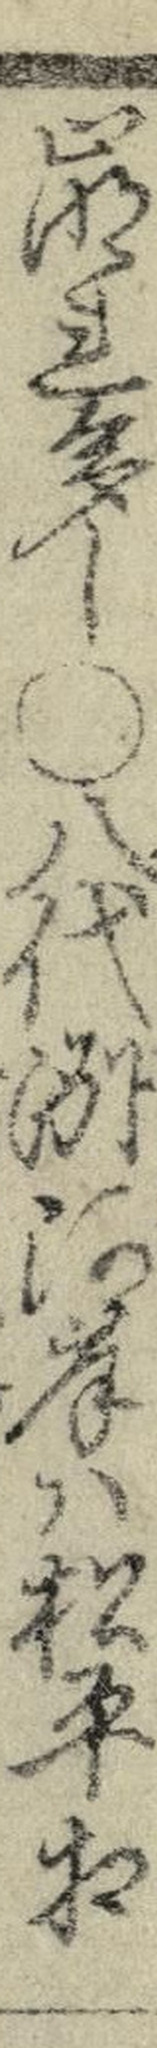崩れ多し〇八代洲河岸ハ松平相
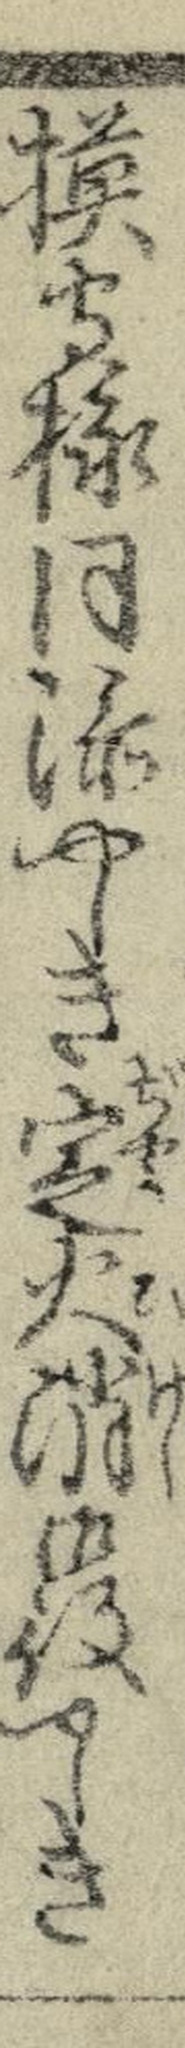模守同添やしき定火消御役やしき
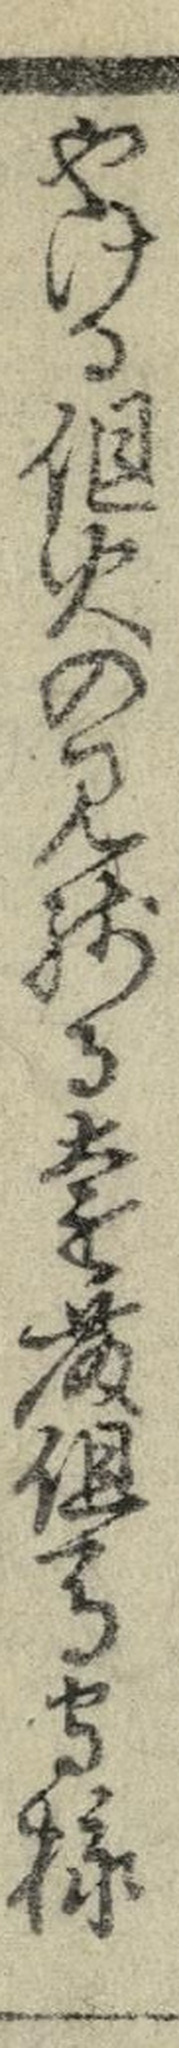やける但火の見残る遠藤但馬守様
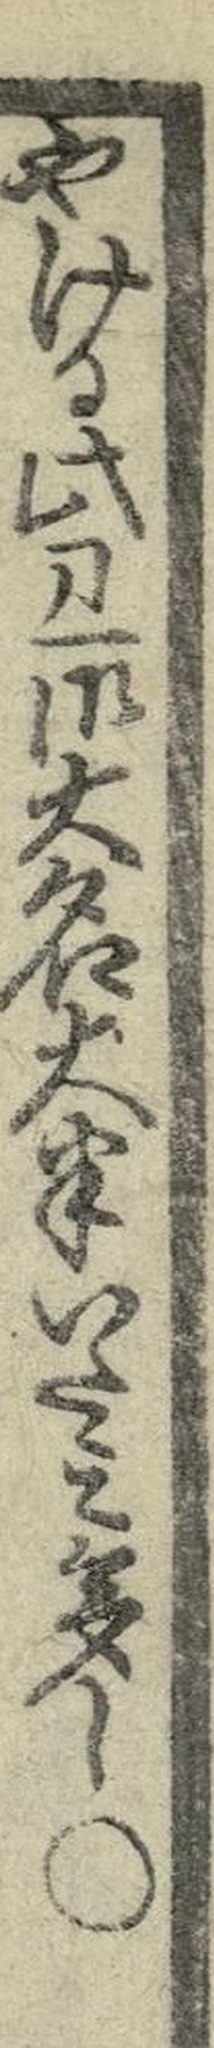やける此辺御大名大半いたみ多し〇
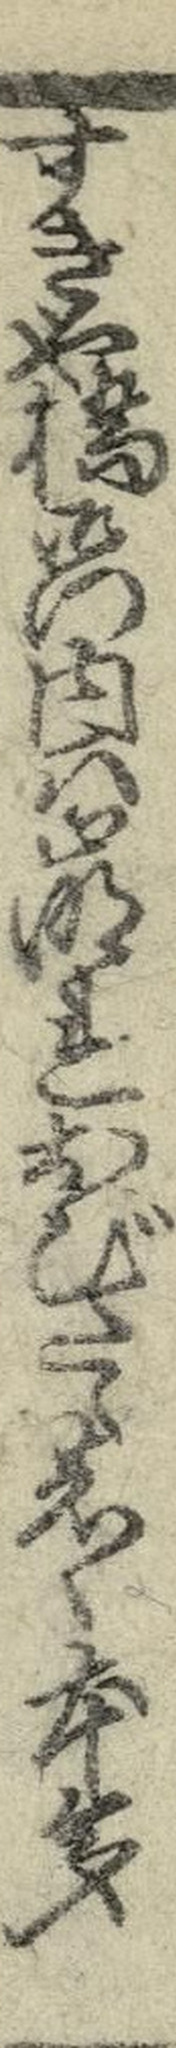すきや橋御門内ハ崩れおびたゝしく本多
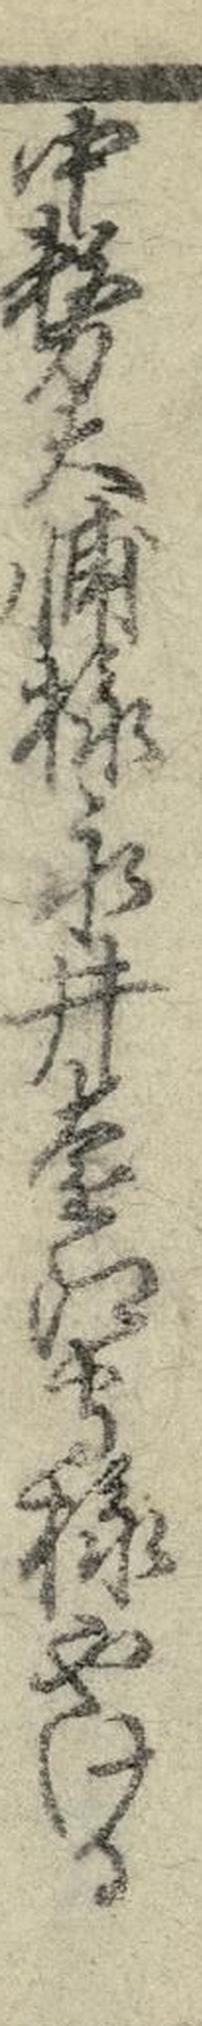中務大輔様永井遠江守様やける
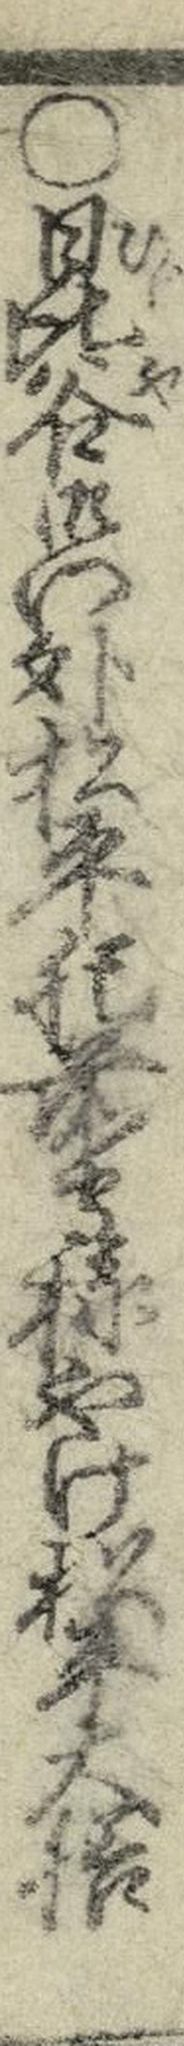〇日比谷御門外松平肥前守様やけ松平大膳
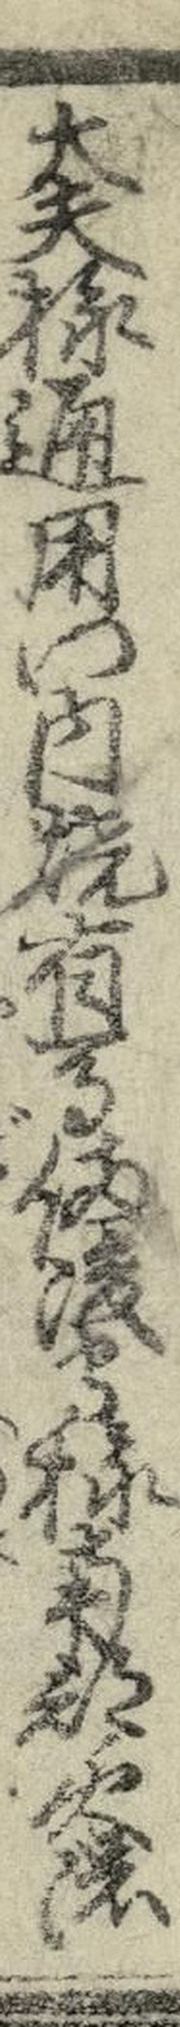大夫様通用門内焼有馬佐渡守様南部美濃
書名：地震並出火細見記
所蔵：東京大学地震研究所図書室 Earthquake Research Institute Library, The University of Tokyo, JAPAN
